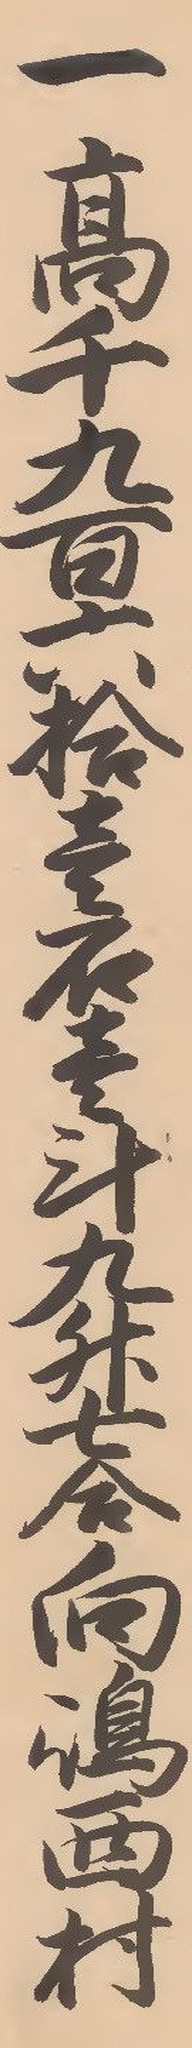一高千九百六拾壱石壱斗九升七合向島西村
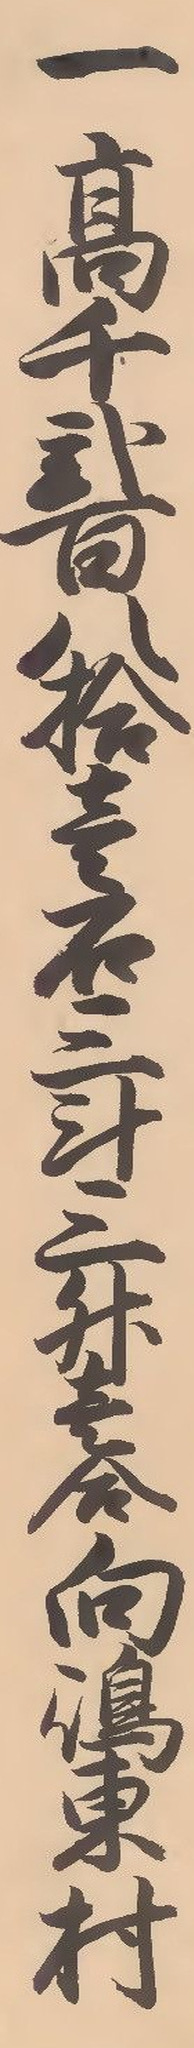一高千弐百八拾壱石三斗三升壱合向島東村

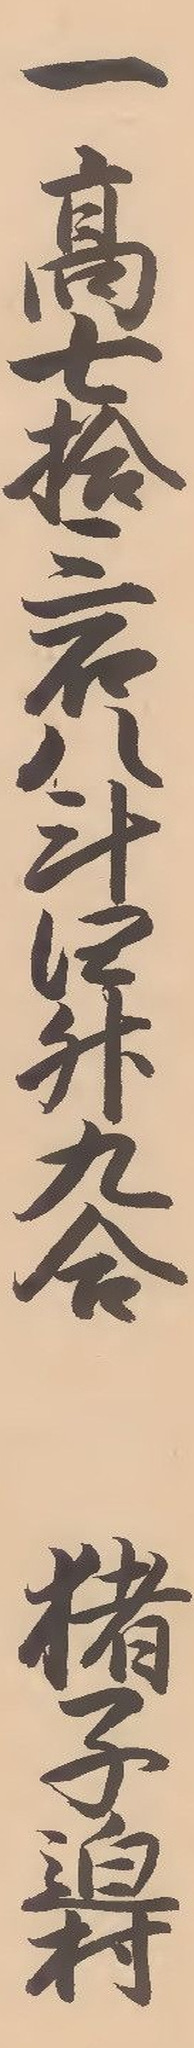一高七拾三石八斗四升九合猪子迫村
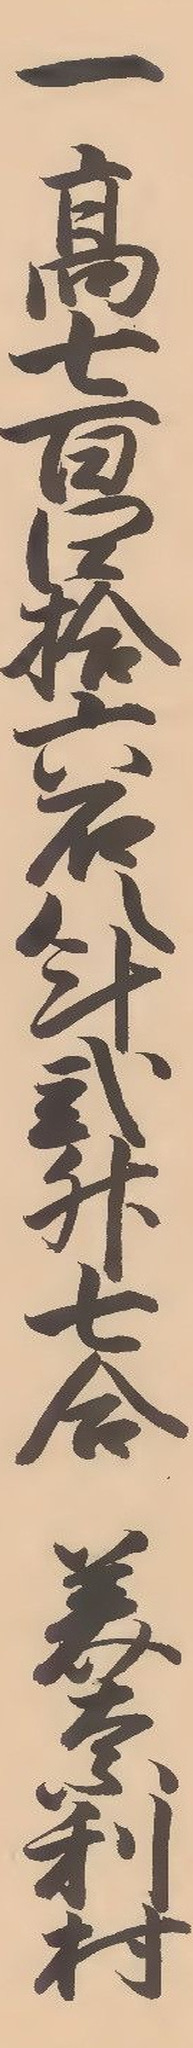一高七百四拾六石八斗弐升七合美奈利村
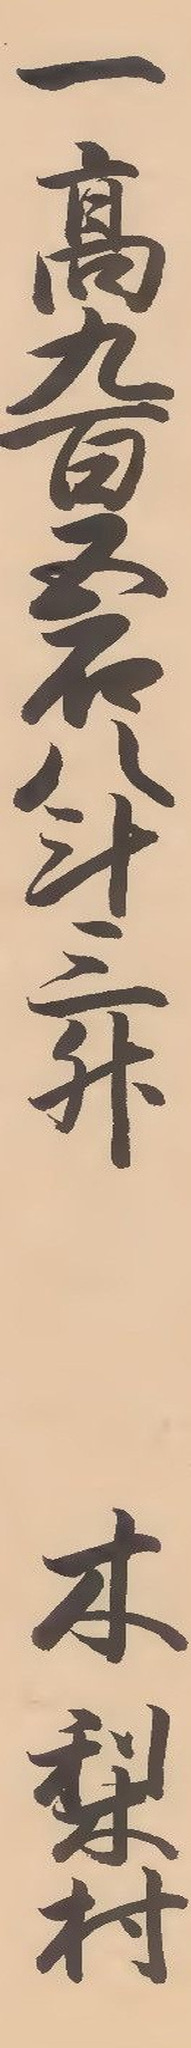一高九百五石八斗三升木梨村
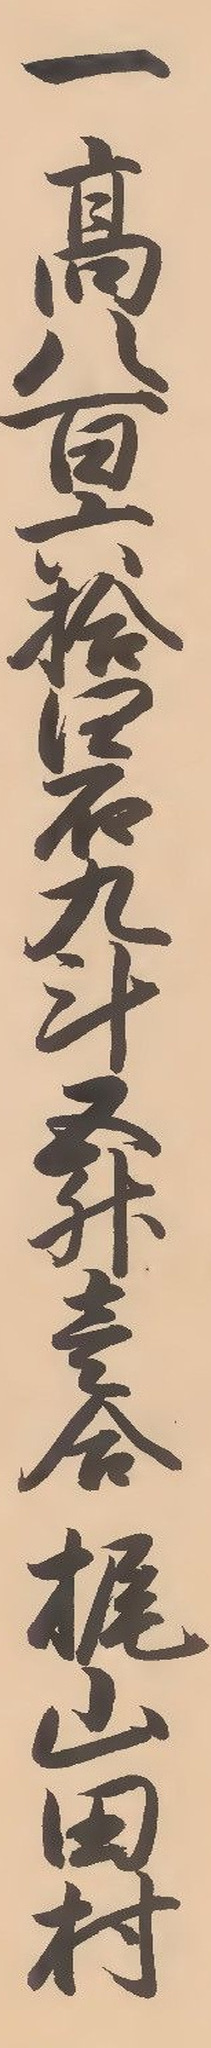一高八百六拾四石九斗五升壱合梶山田村
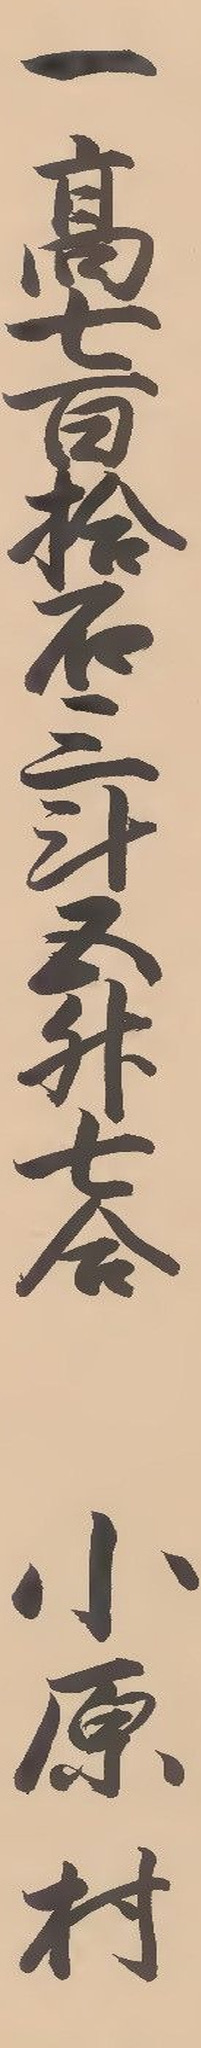一高七百拾石三斗五升七合小原村
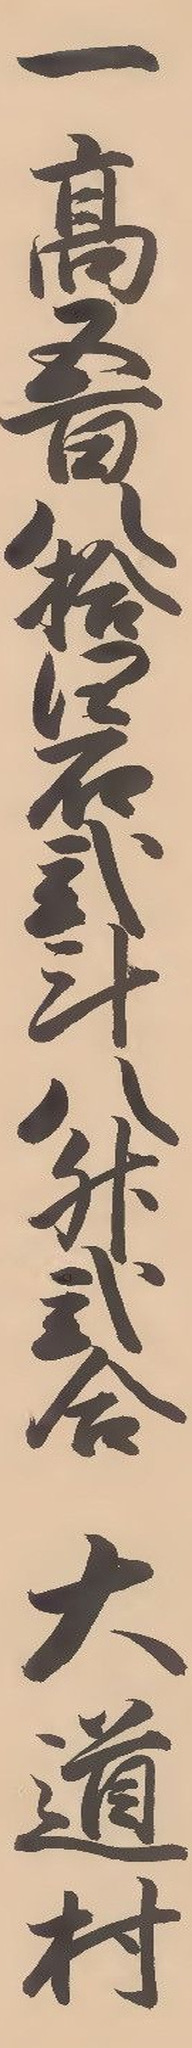一高五百八拾四石弐斗八升弐合大道村
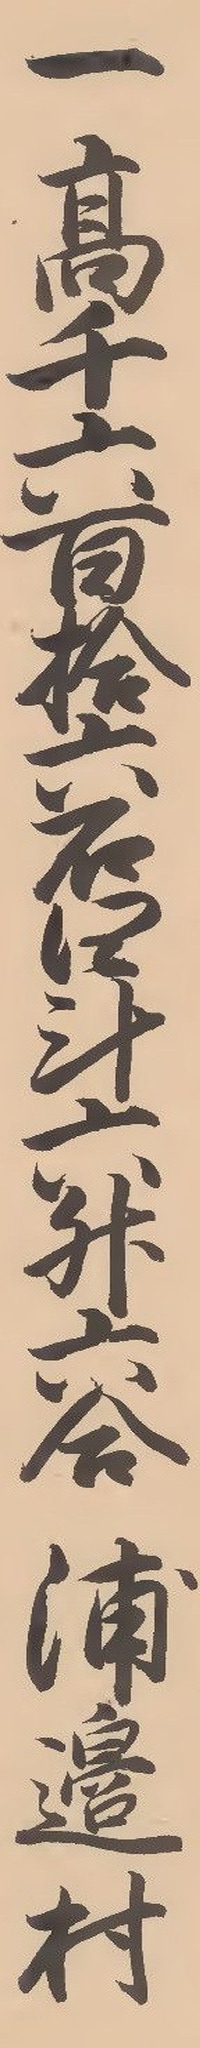一高千六百拾六石四斗六升六合浦辺村
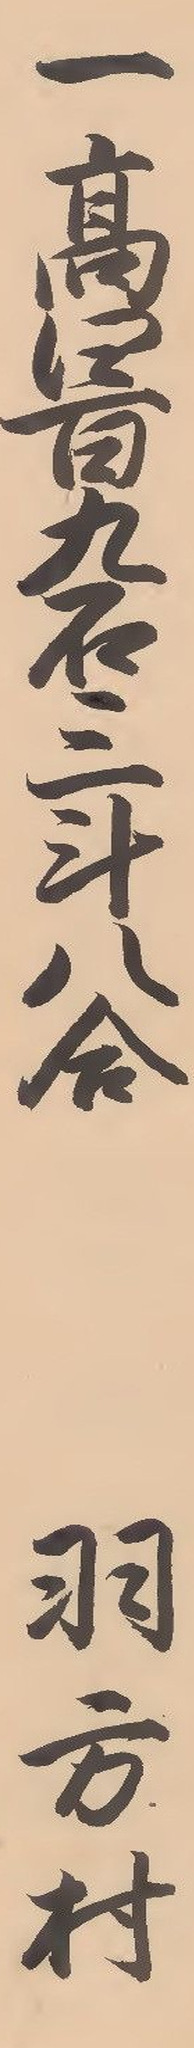一高四百九石三斗八合羽方村

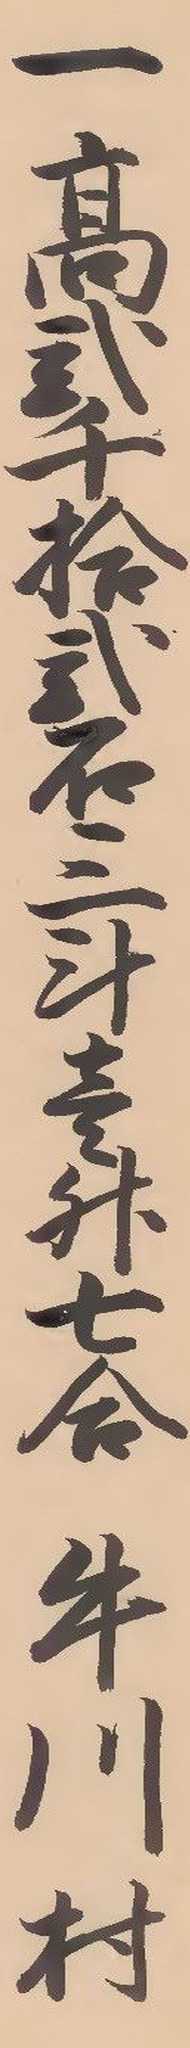一高弐千拾弐石三斗壱升七合牛川村
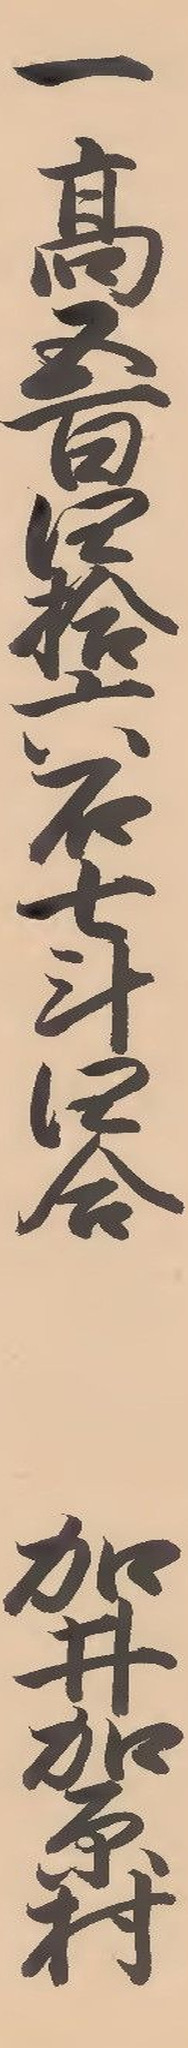一高五百四拾六石七斗四合加井加原村
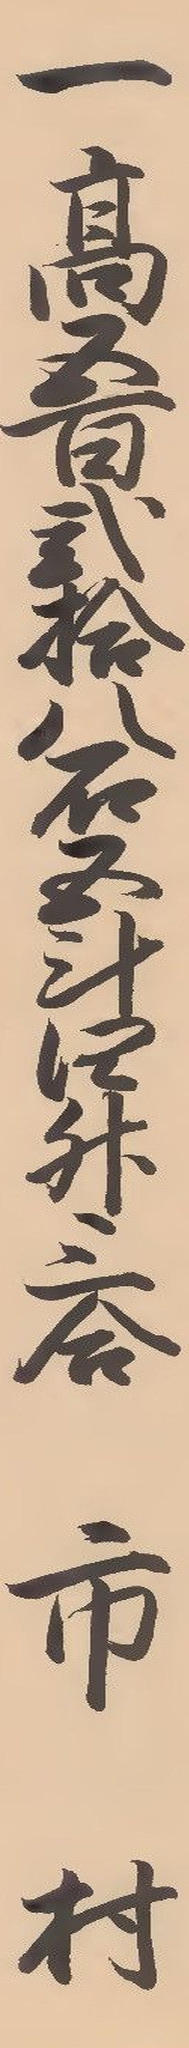一高五百弐拾八石五斗四升三合市村
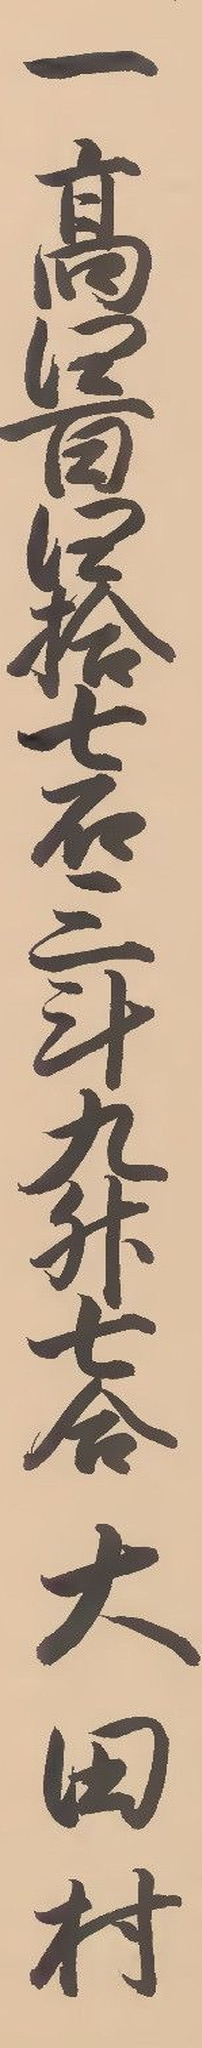一高四百四拾七石三斗九升七合大田村
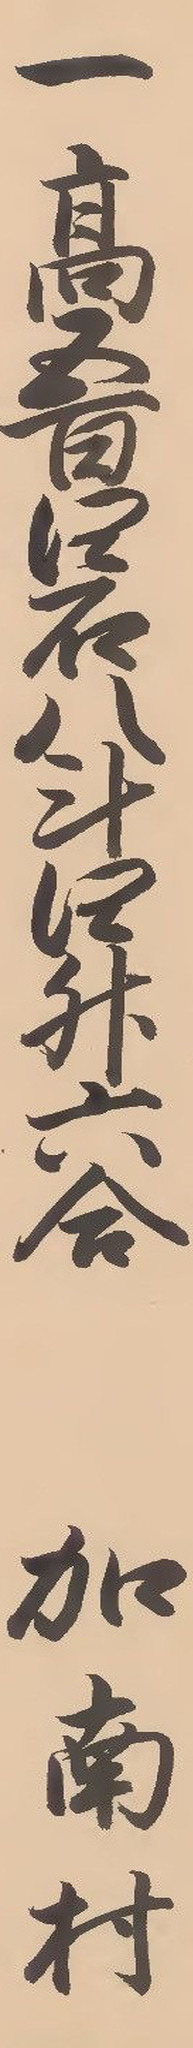一高五百四石八斗四升六合加南村
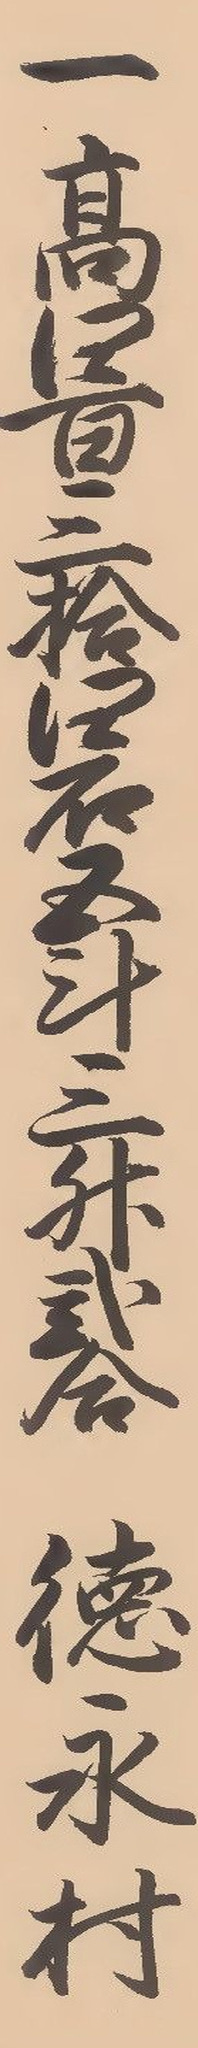一高四百三拾四石五斗三升弐合徳永村
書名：備後国郷帳
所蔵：国立公文書館 National Archives of Japan
